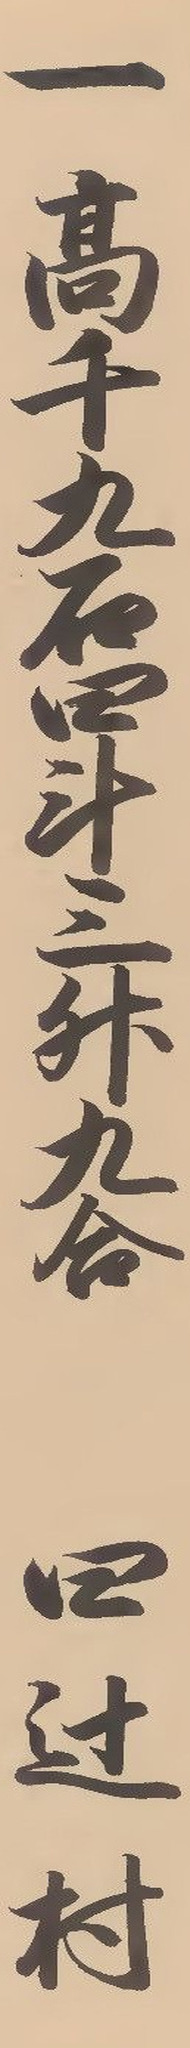一高千九石四斗三升九合四辻村
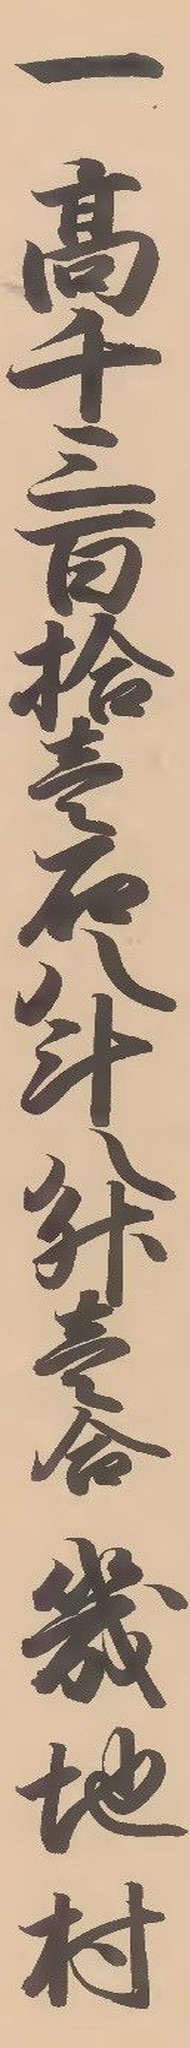一高千三百拾壱石八斗八升壱合幾地村

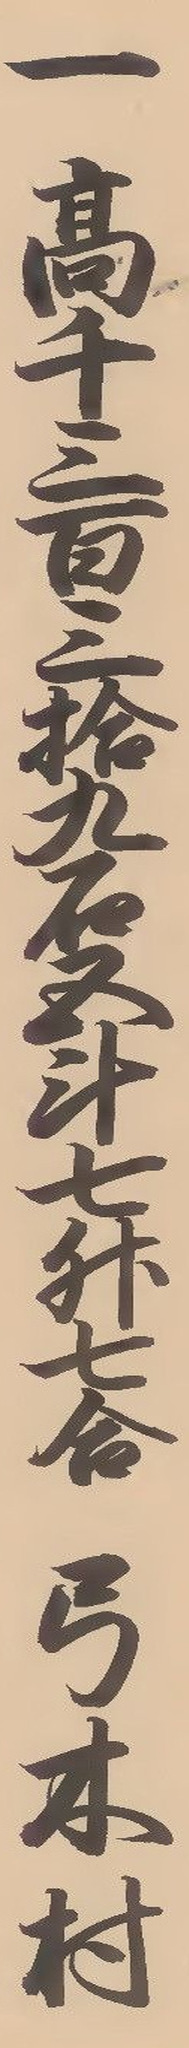一高千三百三拾九石五斗七升七合弓木村
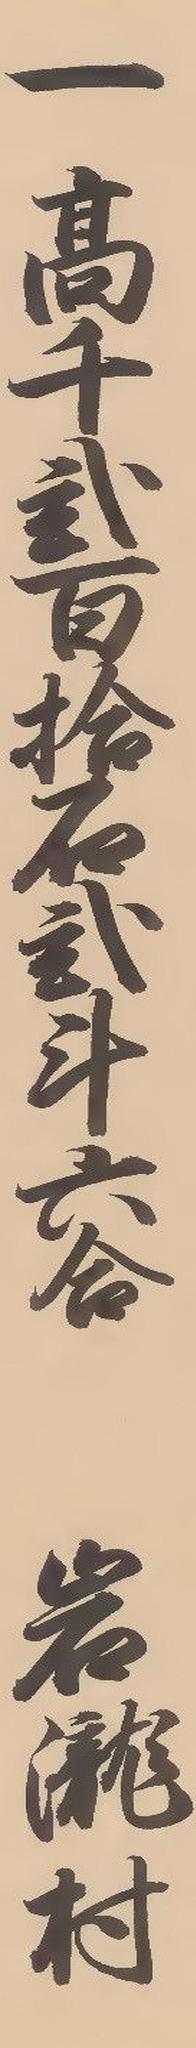一高千弐百拾石弐斗六合岩滝村
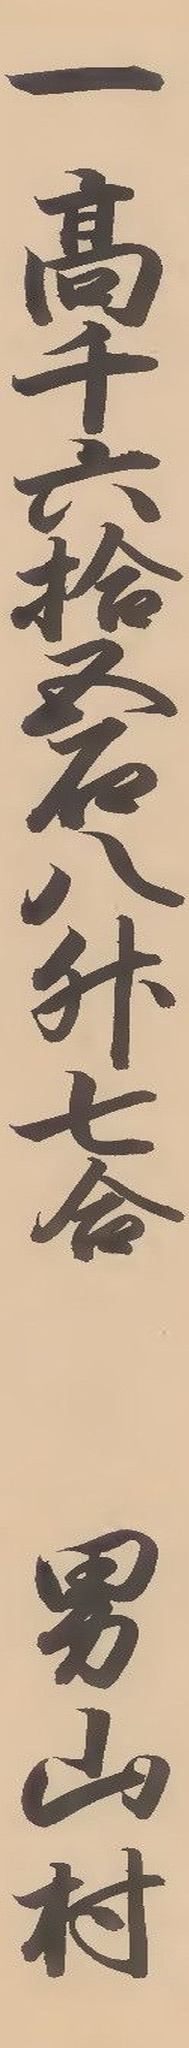一高千六拾五石八升七合男山村
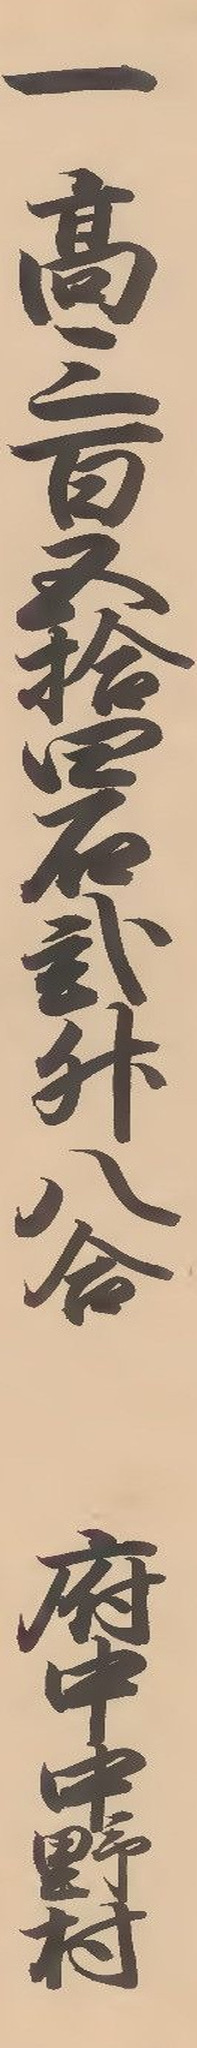一高三百五拾四石弐升八合府中中野村
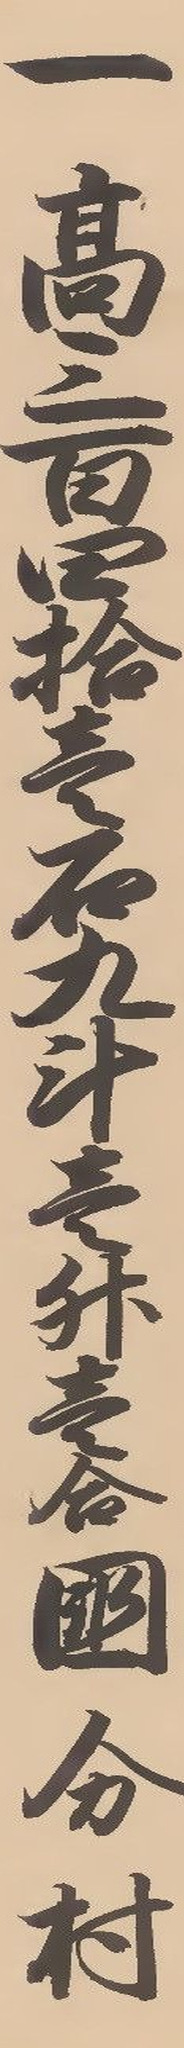一高三百四拾壱石九斗壱升壱合国分村
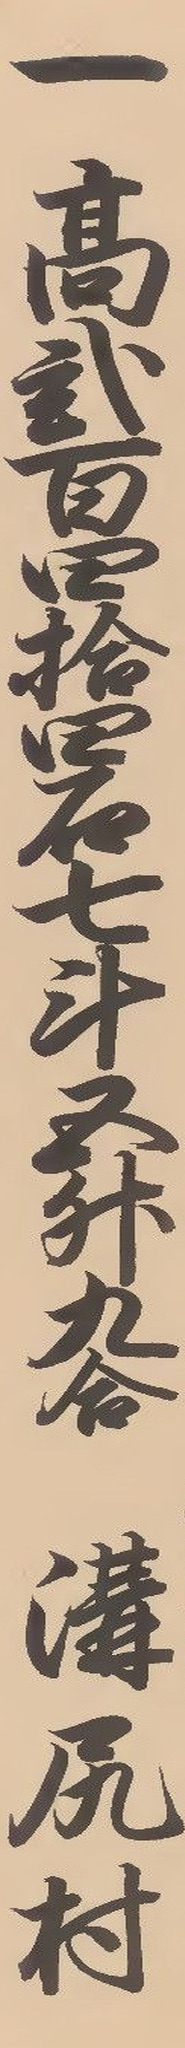一高弐百四拾四石七斗五升九合溝尻村
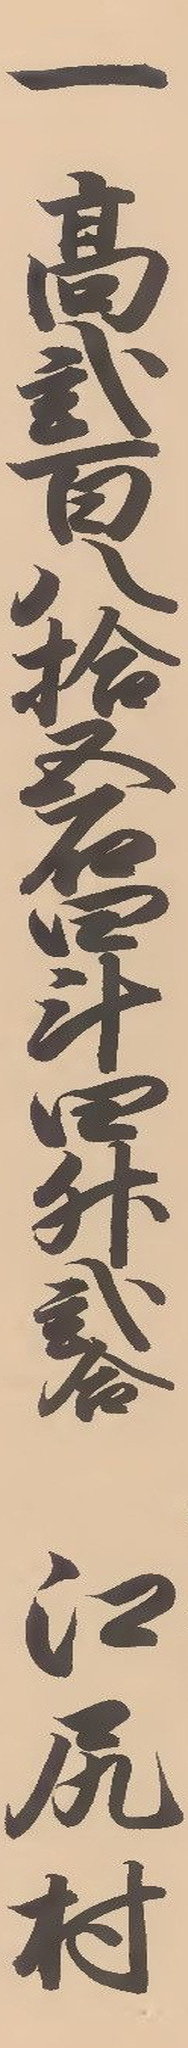一高弐百八拾五石四斗四升弐合江尻村
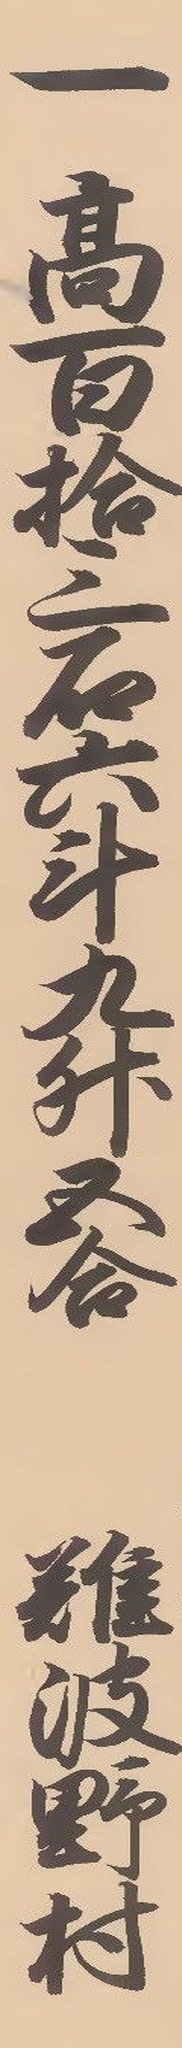一高百拾三石六斗九升五合難波野村

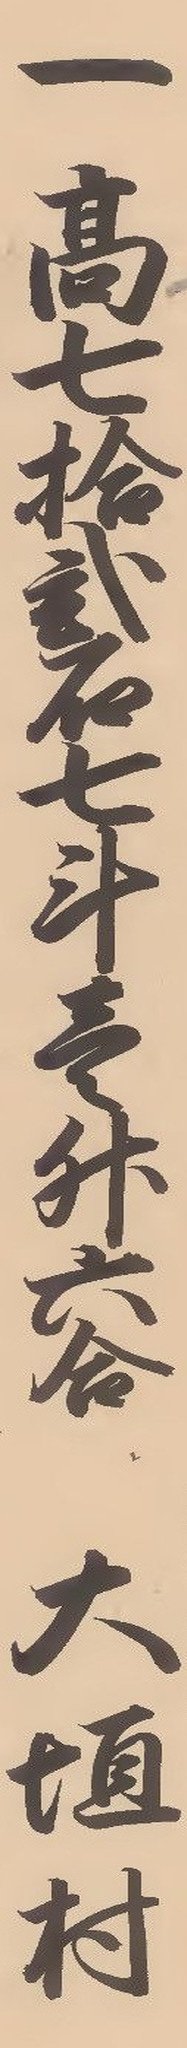一高七拾弐石七斗壱升六合大垣村
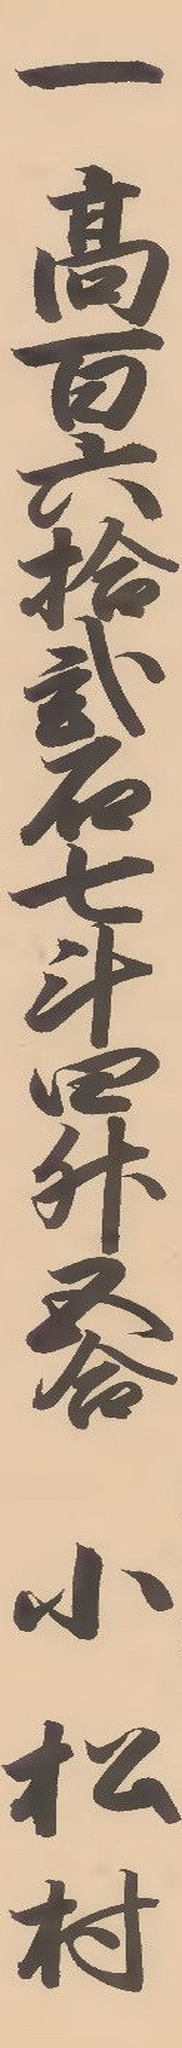一高百六拾弐石七斗四升五合小松村
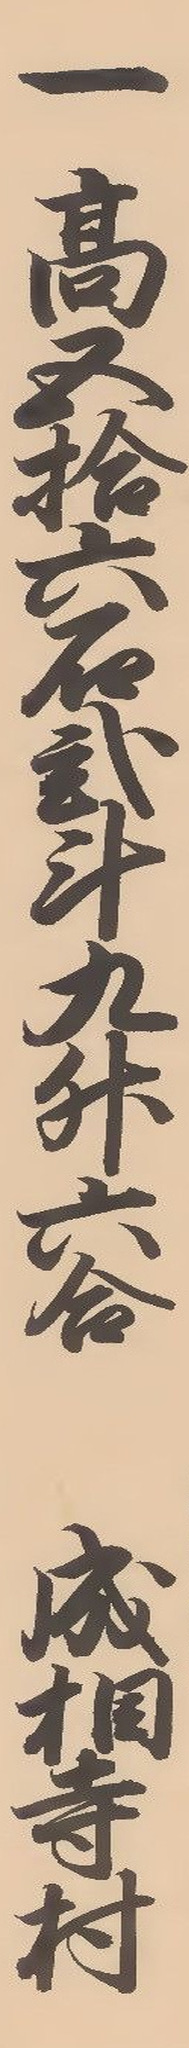一高五拾六石弐斗九升六合成相寺村
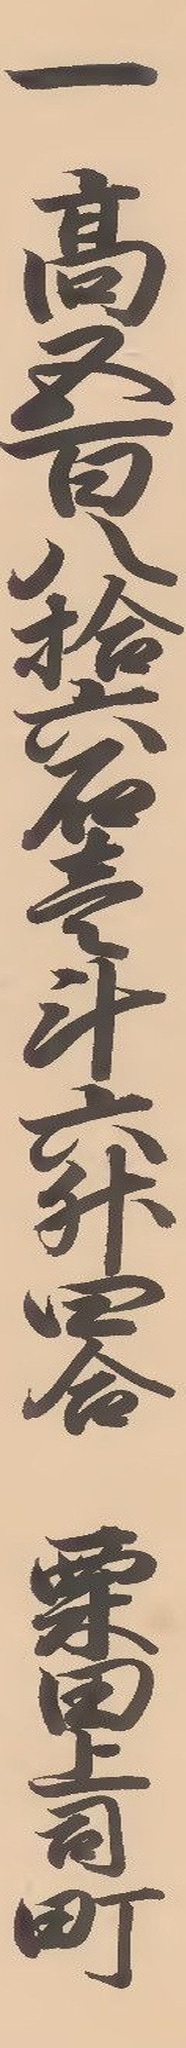一高五百八拾六石壱斗六升四合栗田上司町
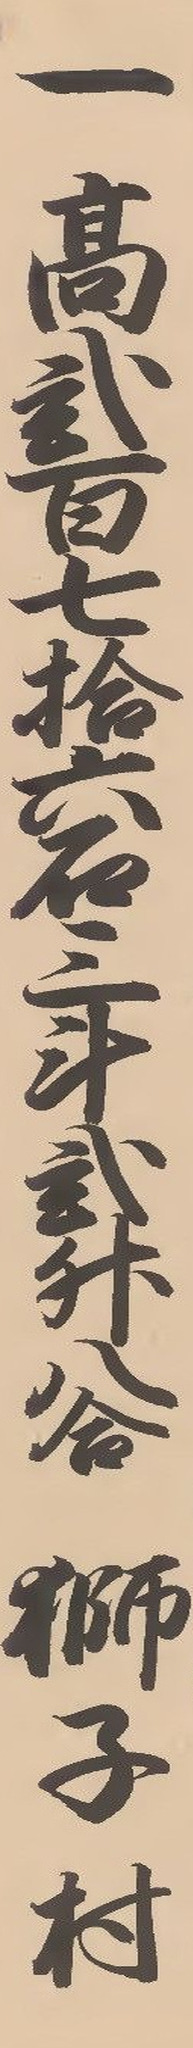一高弐百七拾六石三斗弐升八合獅子村
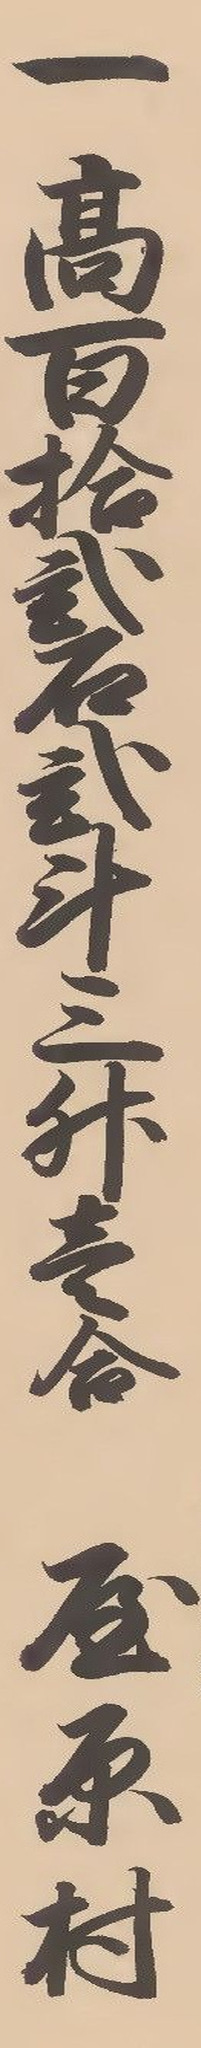一高百拾弐石弐斗三升壱合屋原村
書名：丹後国郷帳
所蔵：国立公文書館 National Archives of Japan
